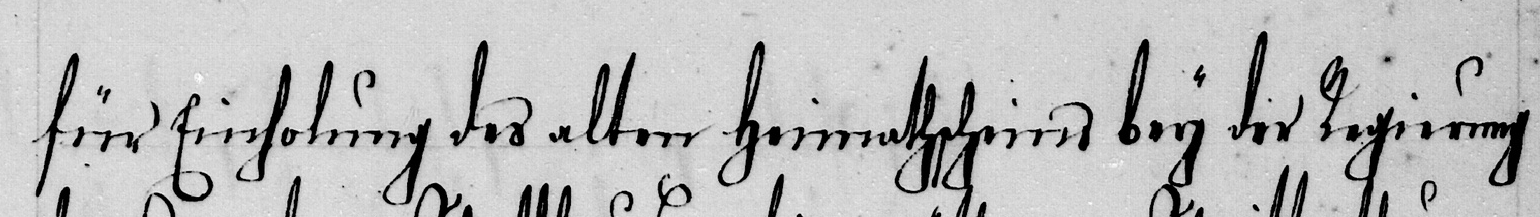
für Einholung des alten Heimathscheins bey der Regierung
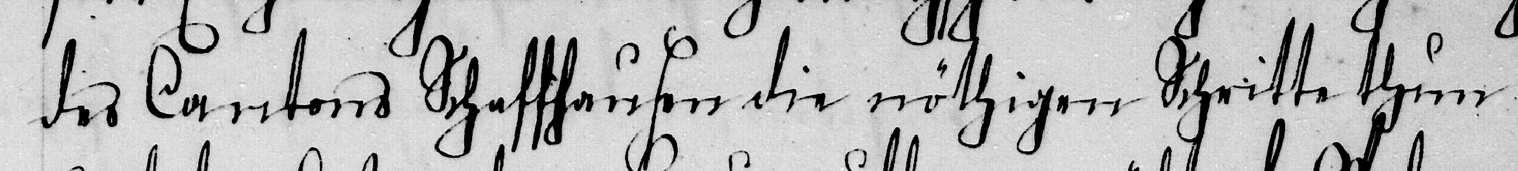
des Cantons Schaffhausen die nöthigen Schritte thun
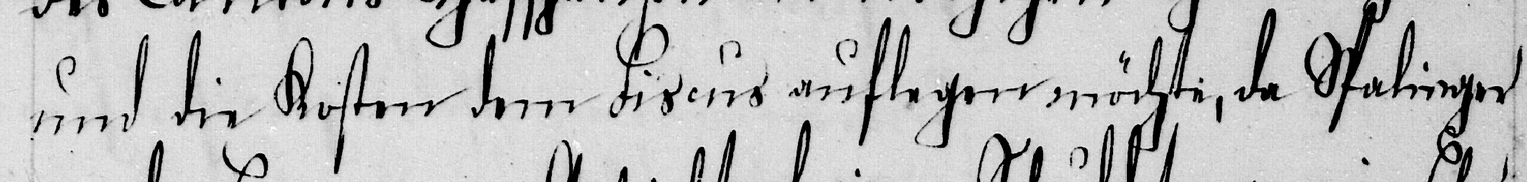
und die Kosten dem Fiscus auflegen möchte, da Spalinger
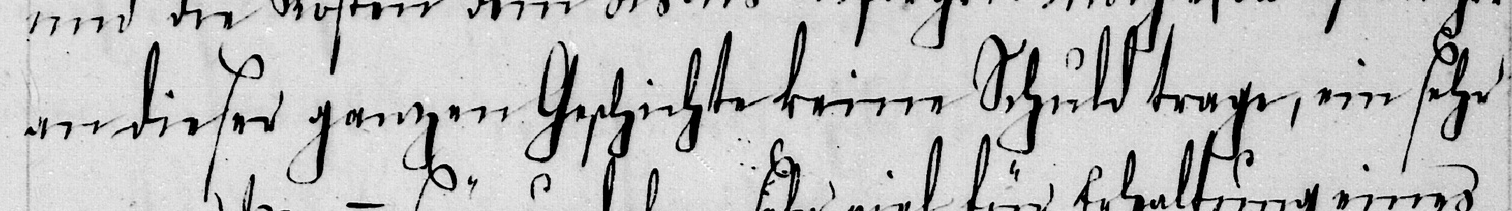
an dieser ganzen Geschichte keine Schuld trage, ein sehr
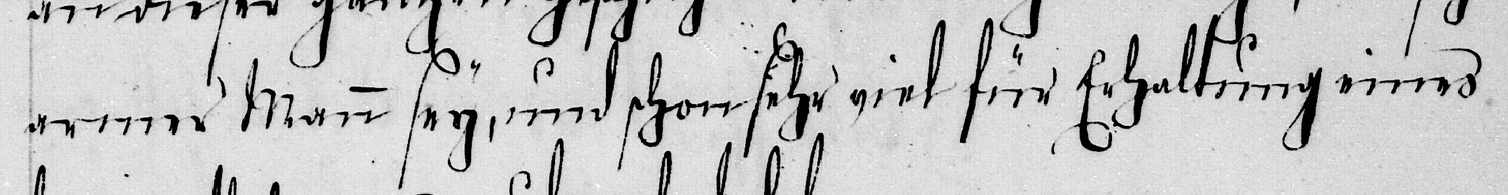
armer Mann sey, und schon sehr viel für Erhaltung eines
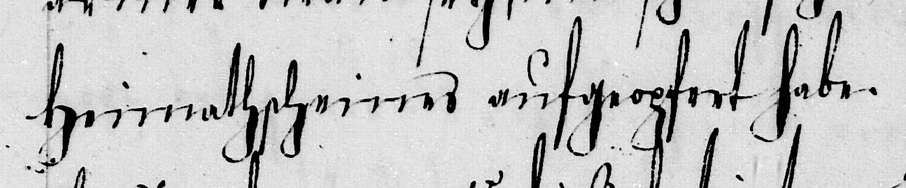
Heimathscheins aufgeopfert habe.
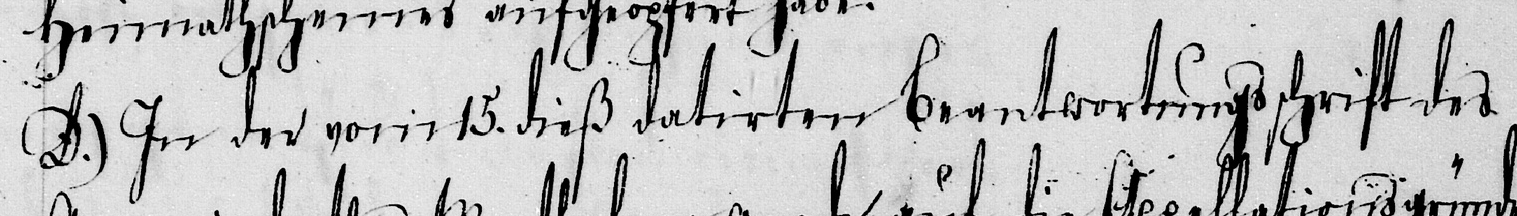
D.) In der vom 15. dieß datirten Beantwortungsschrift des
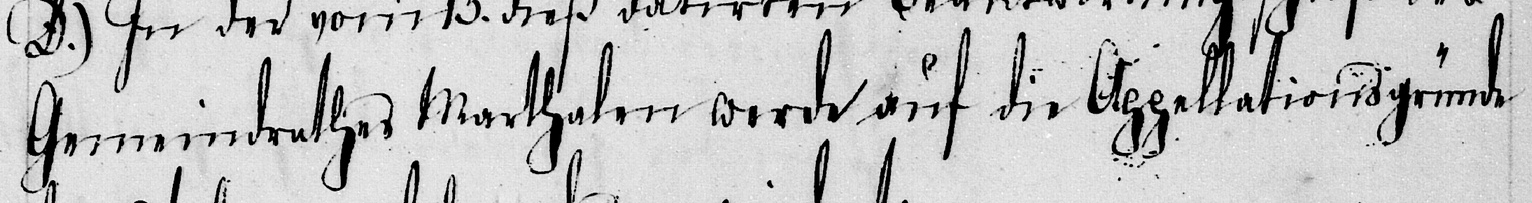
Gemeindrathes Marthalen werde auf die Appellationsgründe
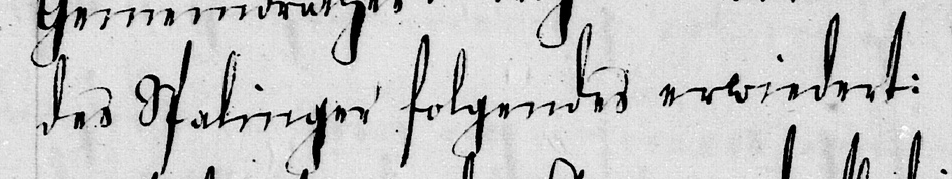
des Spalinger folgendes erwiedert:
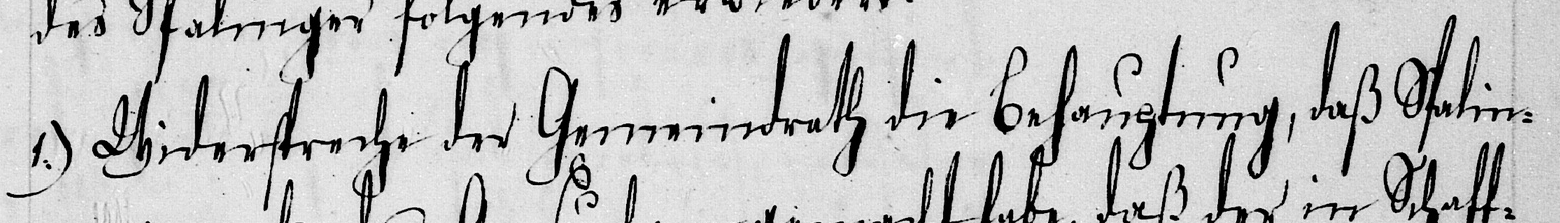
1.) Widerspreche der Gemeindrath die Behauptung, daß Spali¬
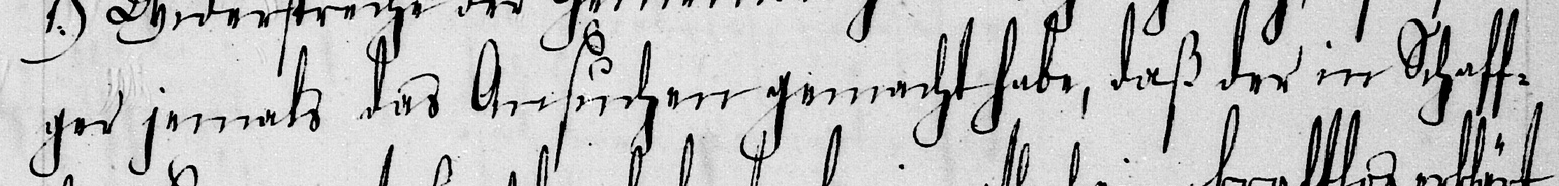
nger jemals das Ansuchen gemacht habe, daß der in Schaff¬
